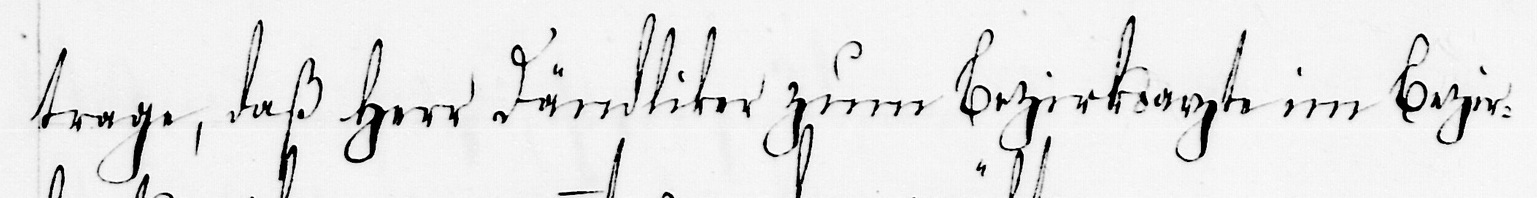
trage, daß Herr Dändliker zum Bezirksarzte im Bezir¬
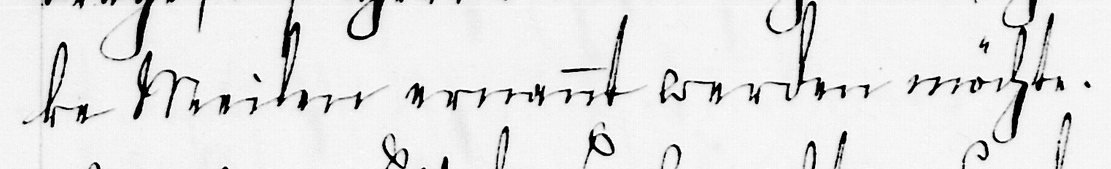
ke Meilen ernannt werden möchte.
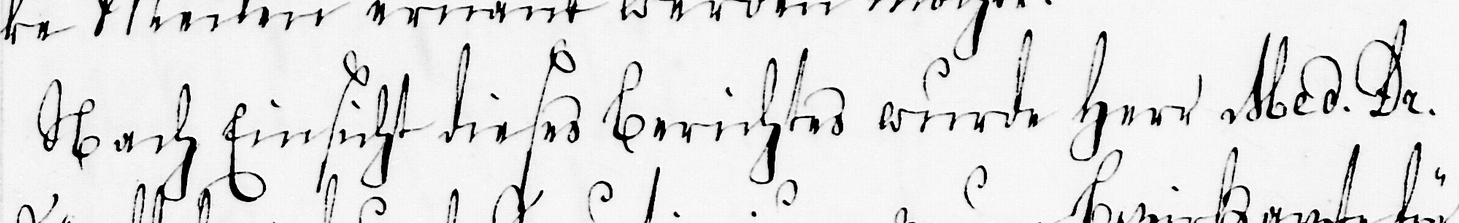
Nach Einsicht dieses Berichtes wurde Herr Med. Dr.
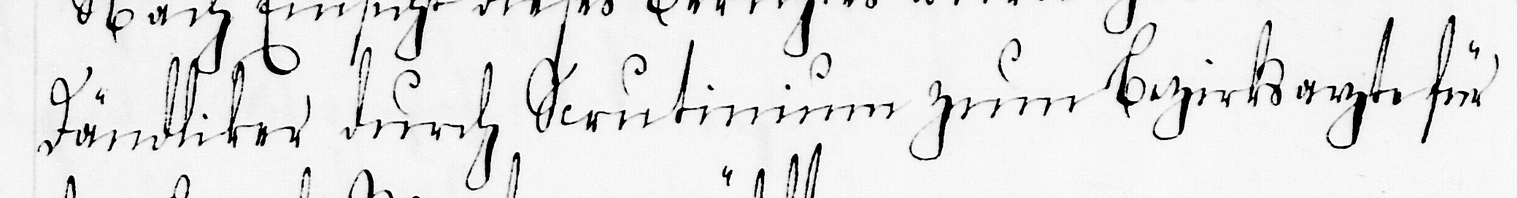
Dändliker durch Scrutinium zum Bezirksarzte für
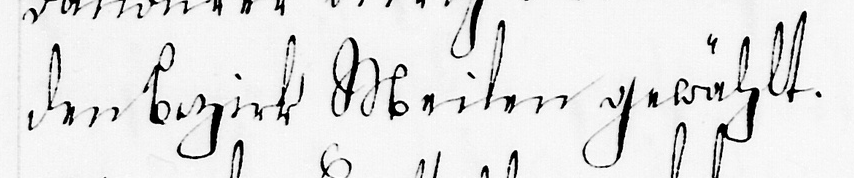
den Bezirk Meilen gewählt.
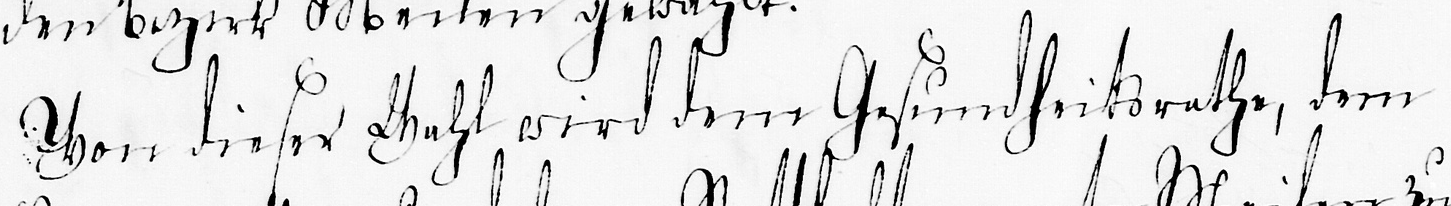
Von dieser Wahl wird dem Gesundheitsrathe, dem
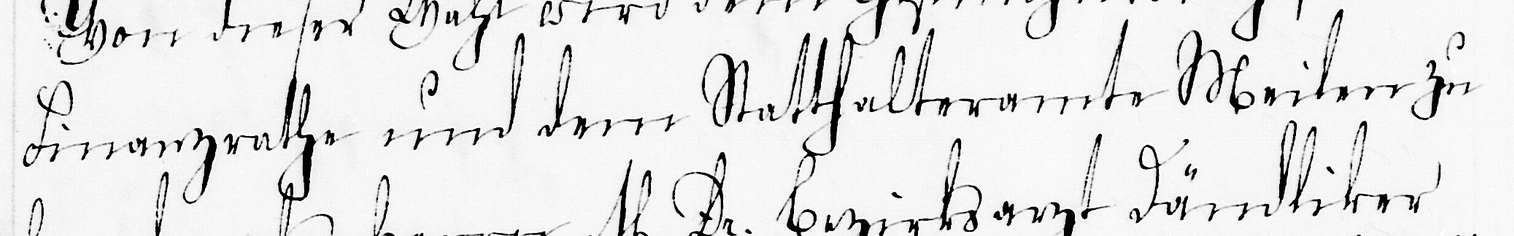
Finanzrathe und dem Statthalteramte Meilen zu
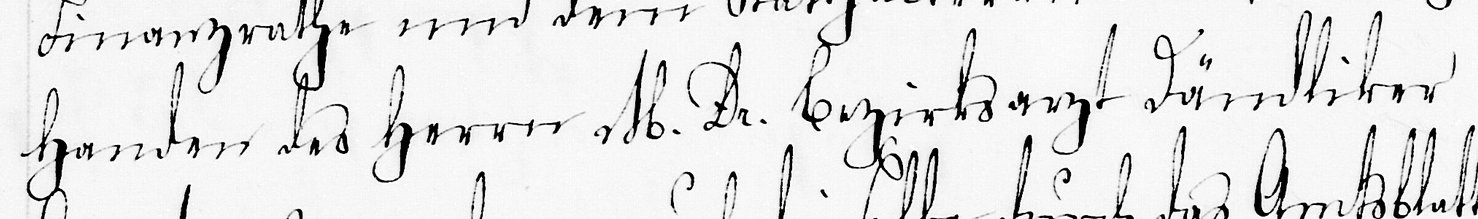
Handen des Herrn M. Dr. Bezirksarzt Dändliker
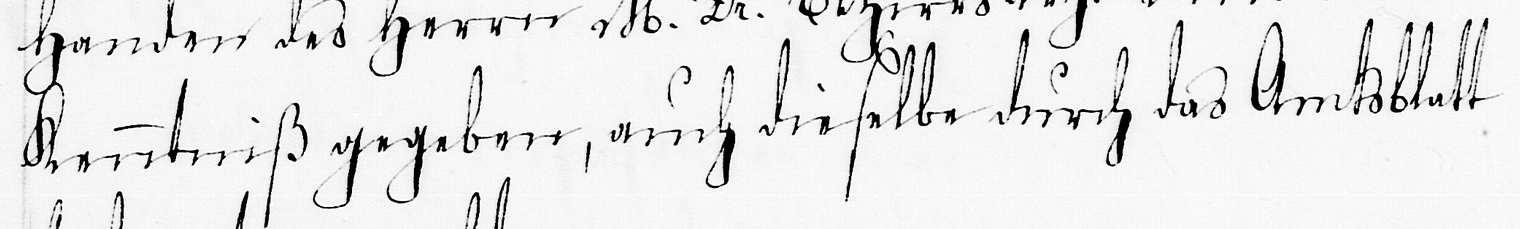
Kenntniß gegeben, auch dieselbe durch das Amtsblatt
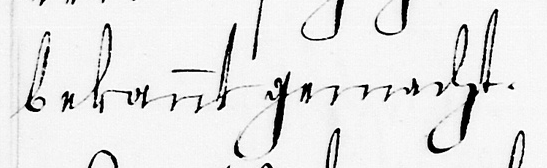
bekannt gemacht.
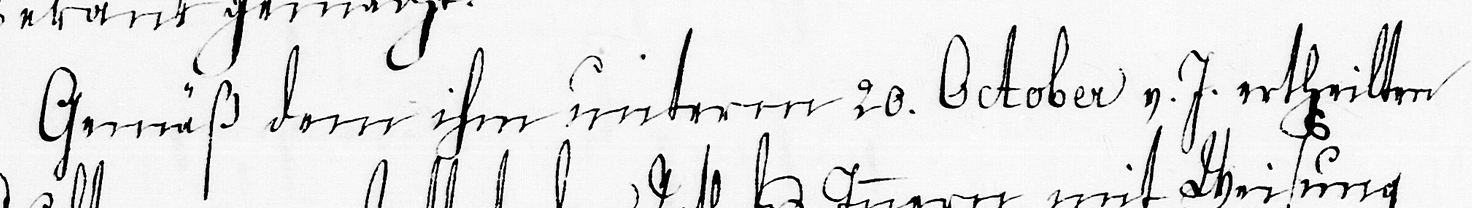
Gemäß dem ihm unterm 20. October v. J. ertheilten
